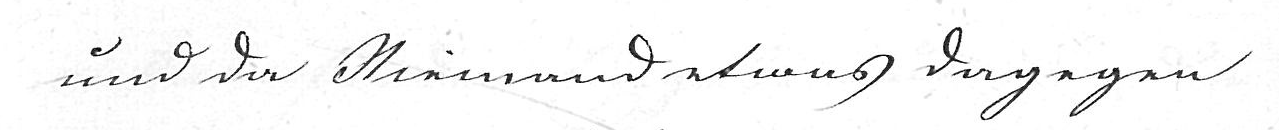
und da Niemand etwas dagegen
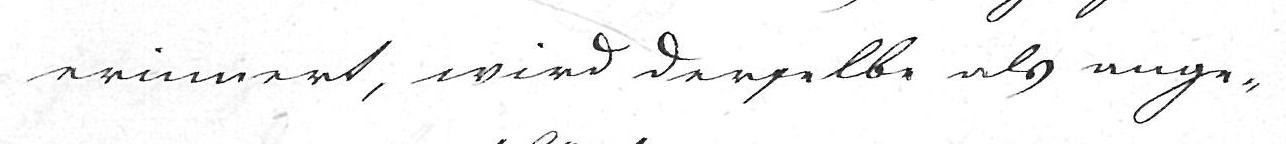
erinnert, wird derselbe als ange-
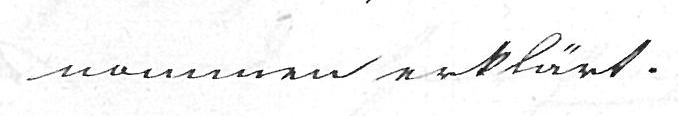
nommen erklärt.
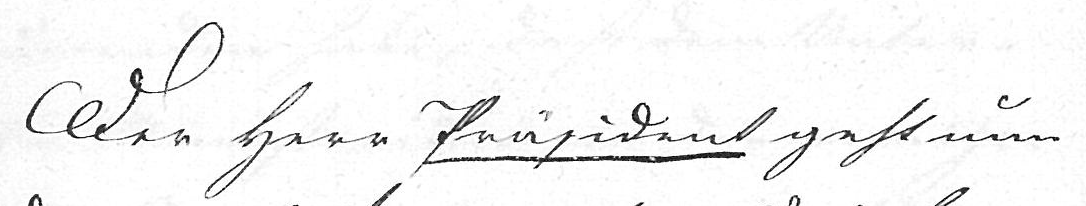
Der Herr Präsident geht nun
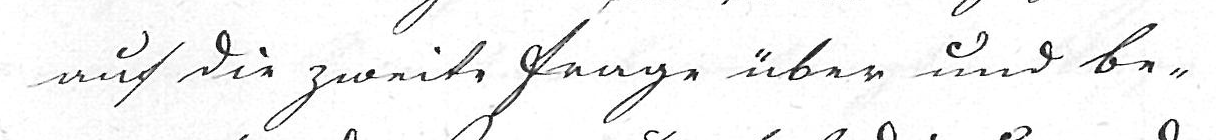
auf die zweite Frage über und be-
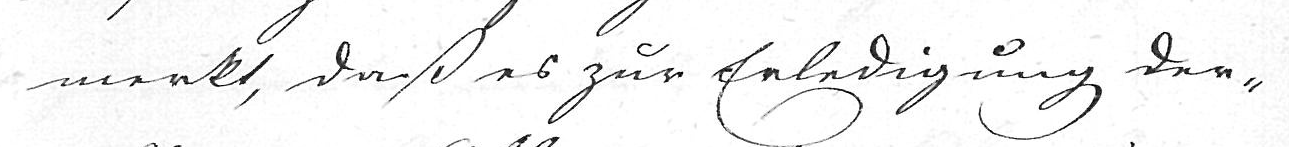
merkt, daß es zur Erledigung der-
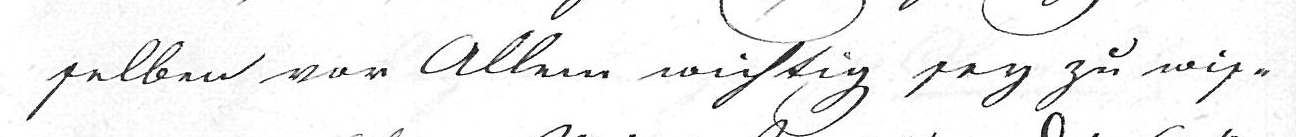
selben vor Allem wichtig sey zu wis-
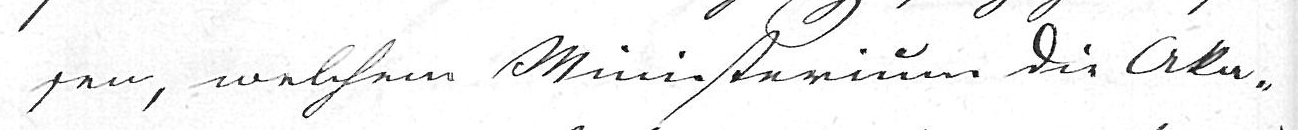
sen, welchem Ministerium der Aka-
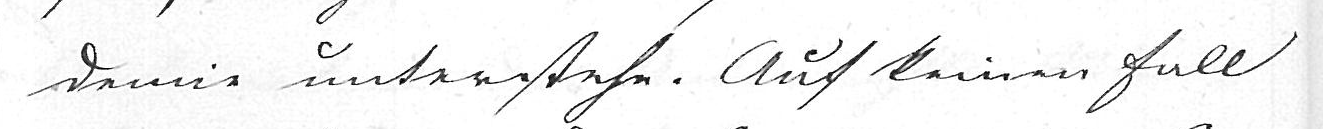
demie unterstehe. Auf keinen Fall
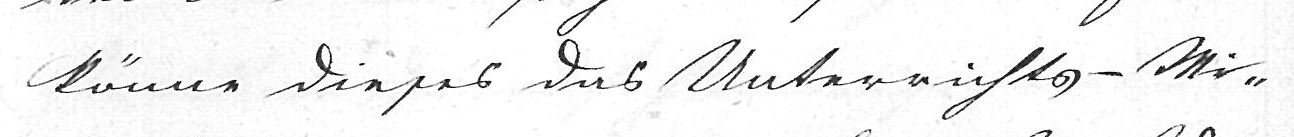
könne dieses das Unterrichts-Mi-
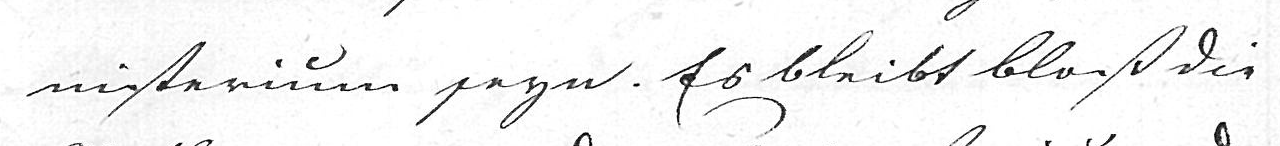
nisterium seyn. Es bleibt bloß die
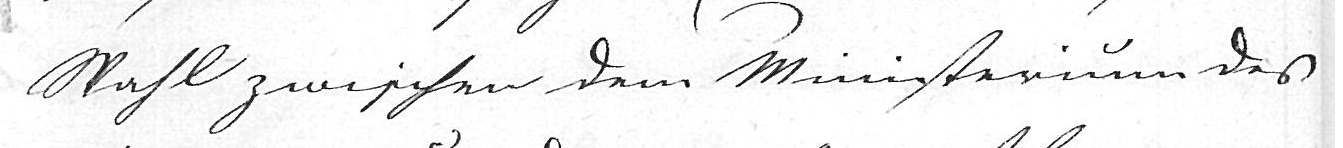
Wahl zwischen dem Ministerium des
